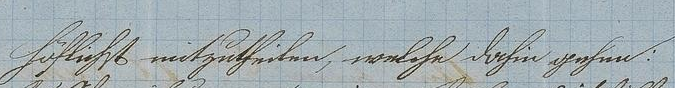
höflichst mitzutheilen, welche dahin gehen:
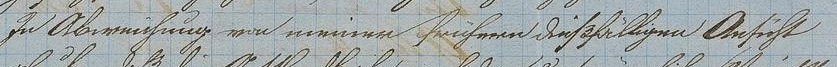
In Abweichung von meiner frühern dießfälligen Ansicht
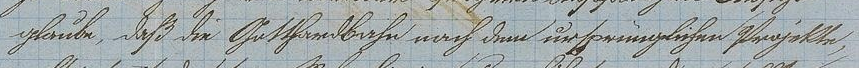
glaube, daß die Gotthardbahn nach dem ursprünglichen Projekte,
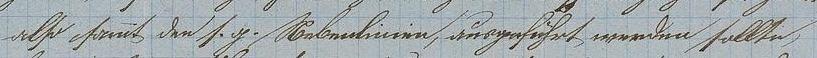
also sammt den s.g. Nebenlinien, ausgeführt werden sollte,
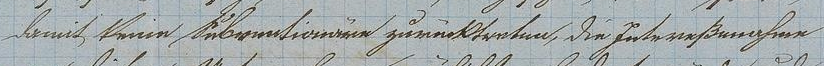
damit keine Subventionäre zurücktreten, die Intereßenahme
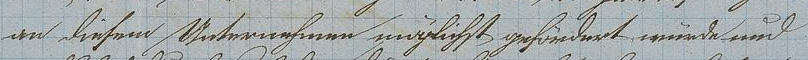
an diesem Unternehmen möglichst gefördert würde und
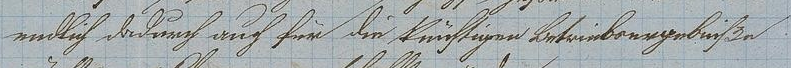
endlich dadurch auch für die künftigen Betriebsergebniße
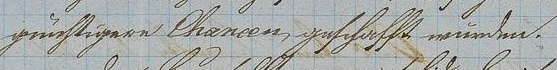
günstigere Chancen geschafft würden.
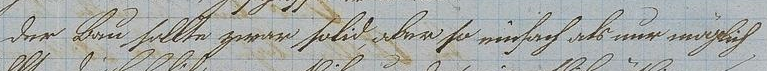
Der Bau sollte zwar solid, aber so einfach als nur möglich
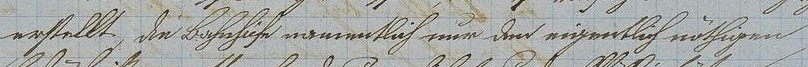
erstellt, die Bahnhöfe namentlich nur den eigentlich nöthigen
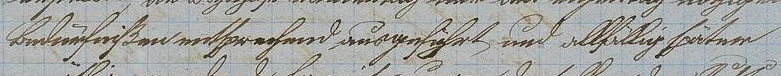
Bedürfnißen entsprechend ausgeführt und allfällig später
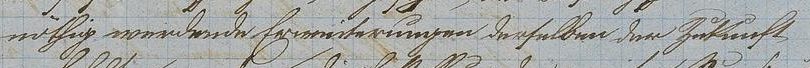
nöthig werdende Erweiterungen derselben der Zukunft
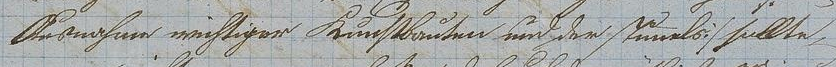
Ausnahme wichtiger Kunstbauten und der Tunnels) sollte,
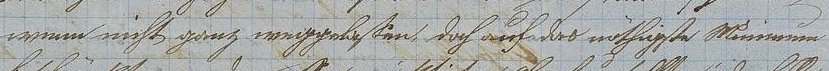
wenn nicht ganz weggelassen, doch auf das nöthgiste Minimum
